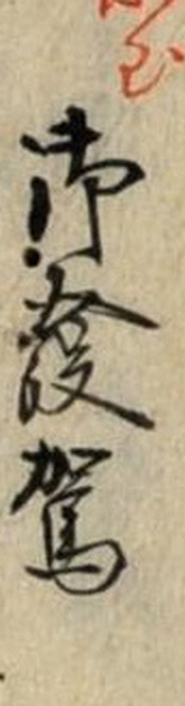御発駕
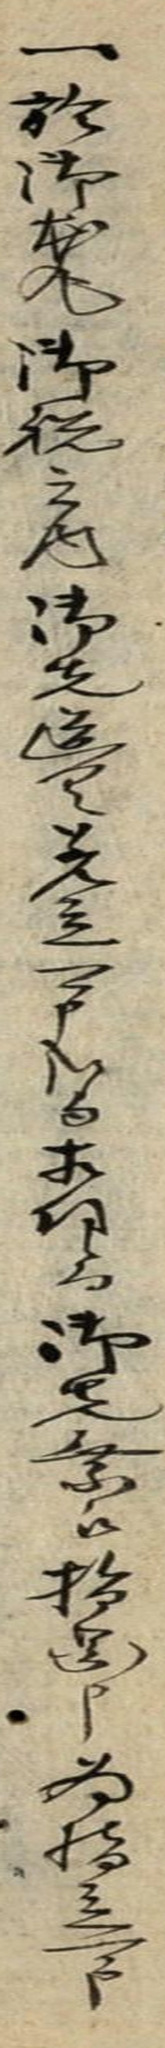一於御本丸御祝之内御先道具差立可申哉と相伺候て御先乗江指図申為指立可申
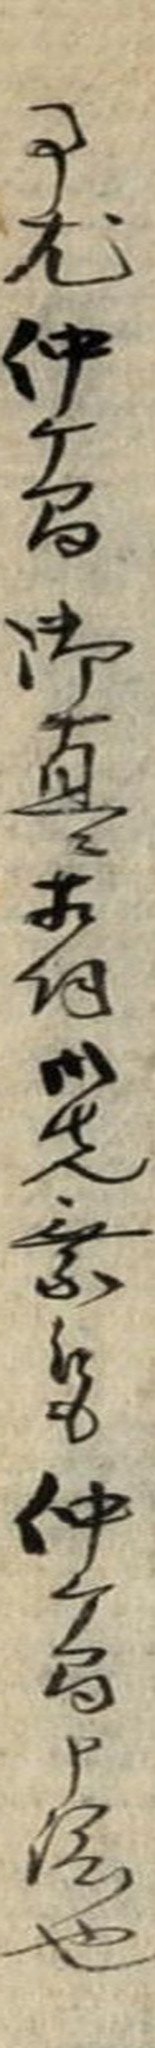事尤仲ヶ間御直に相伺御先乗江も仲ヶ間申渡也
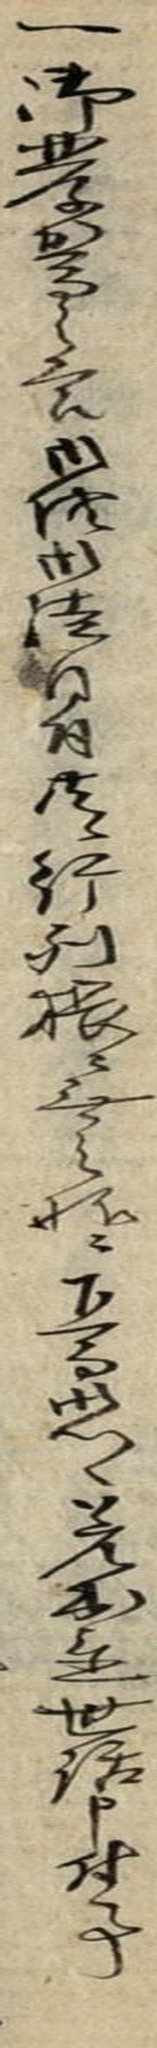一御発駕之節御供御徒目付共へ行列猥に無之様に下馬御門へ差出置世話申付事
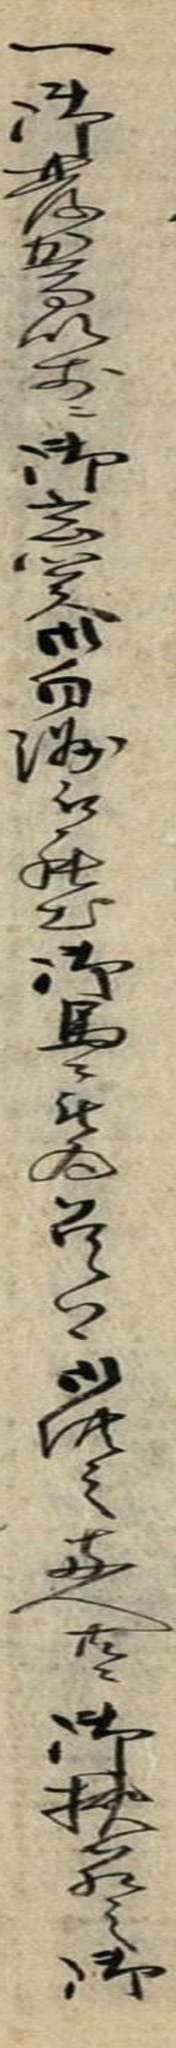一御発駕以前に御玄関御白洲江罷出御馬に被為召候はゝ御供之両人共に御挟箱之御
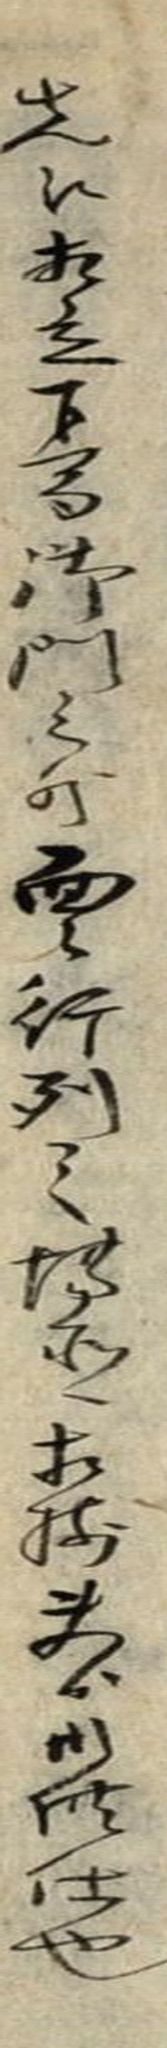先江相立下馬御門之外面々行列之場所へ相揃夫ゟ御供仕也
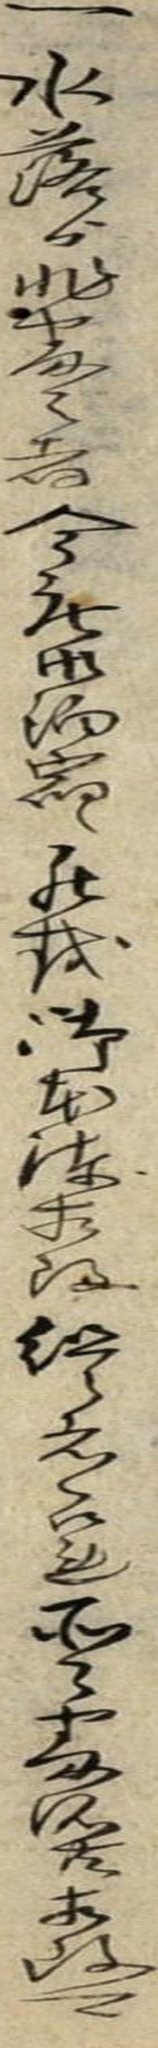一水落ゟ非番之者今庄御泊宿へ罷越御本陣相改組之者召連所々番所共相改可
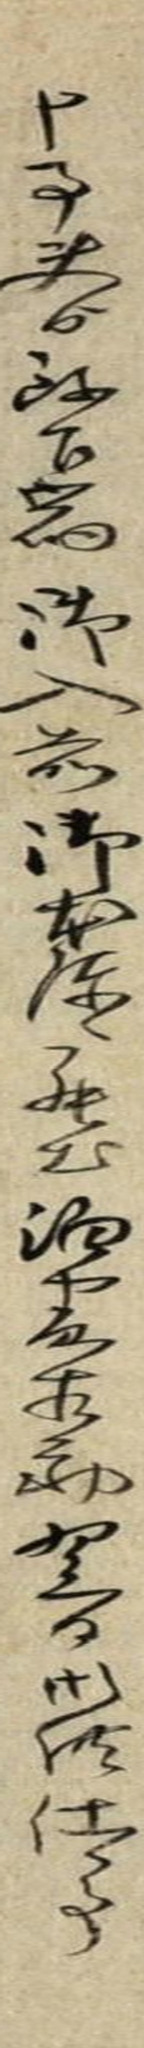申事夫ゟ致下宿御入前御本陣へ罷出泊番相勤翌日御供仕候事
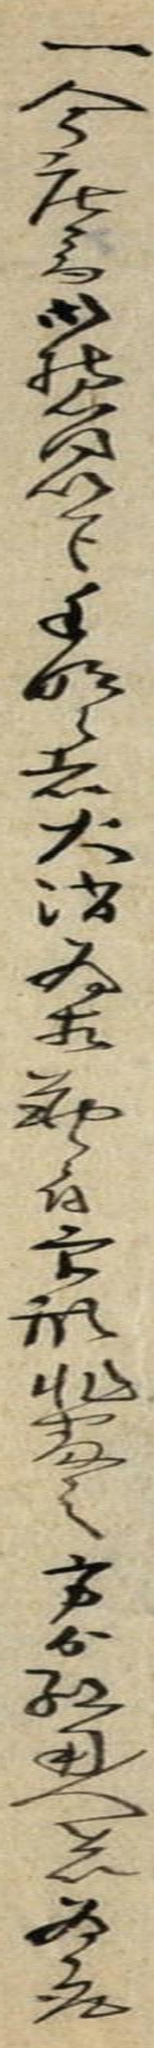一今庄にて御持筒以下手明之者火消為相勤候に付印形非番之方ゟ組用人を以為取
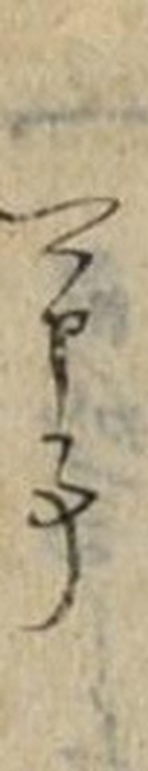可申事
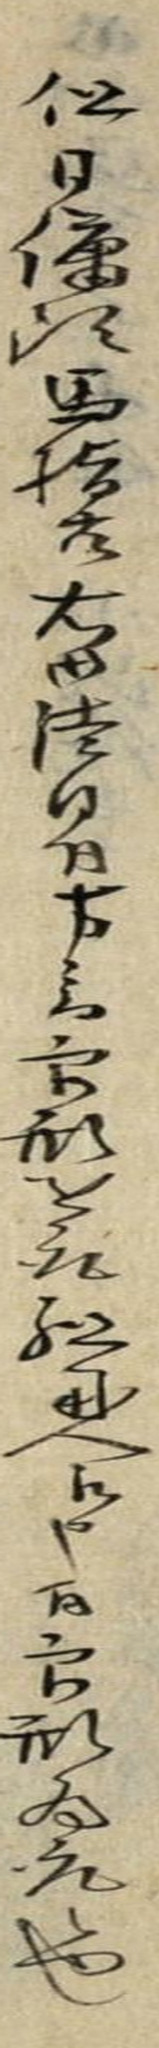但日雇頭馬指共右御徒目付方にて印形を取組用人江申付印形為取候也
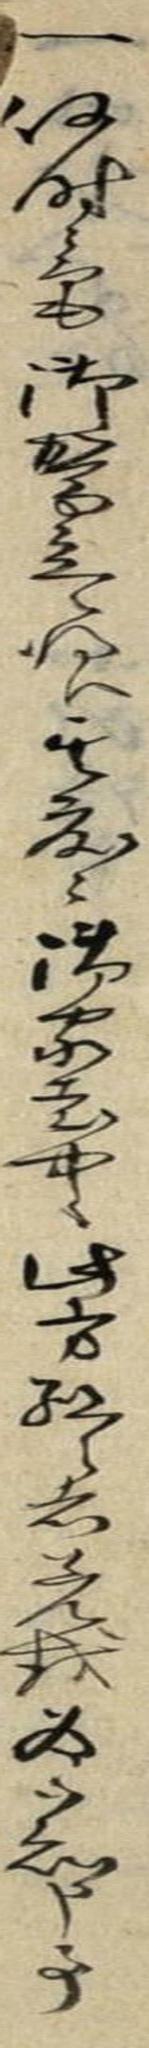一何時にても御駕立候得は其度々御家中へ此方組之者差越為御知申事
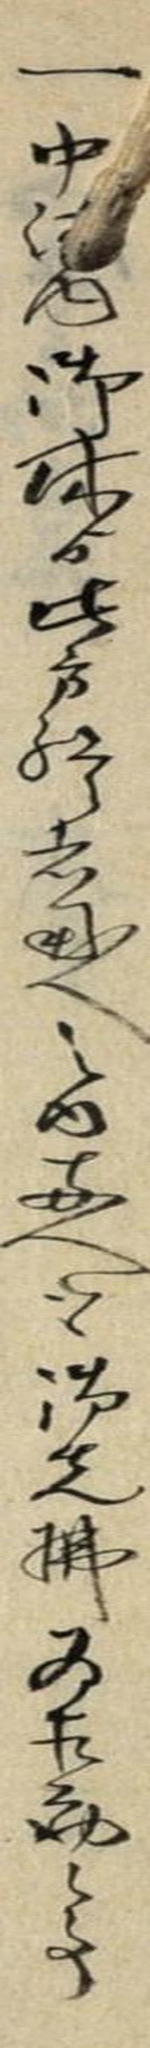一中内御休ゟ此方組之者用人之内両人ツヽ御先払為相勤候事
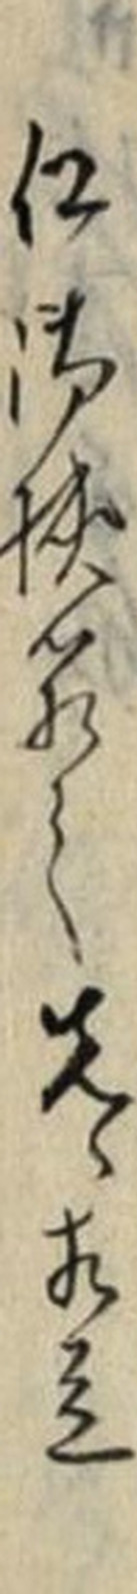但御挟箱之先へ相立
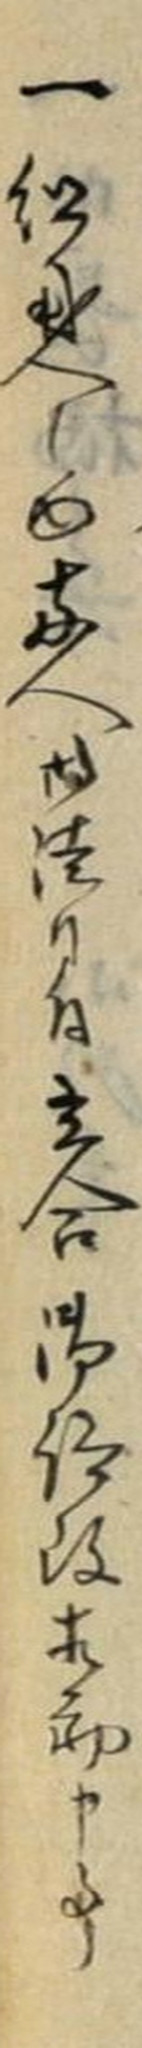一組用人之内両人御徒目付立合御跡改相勤申事
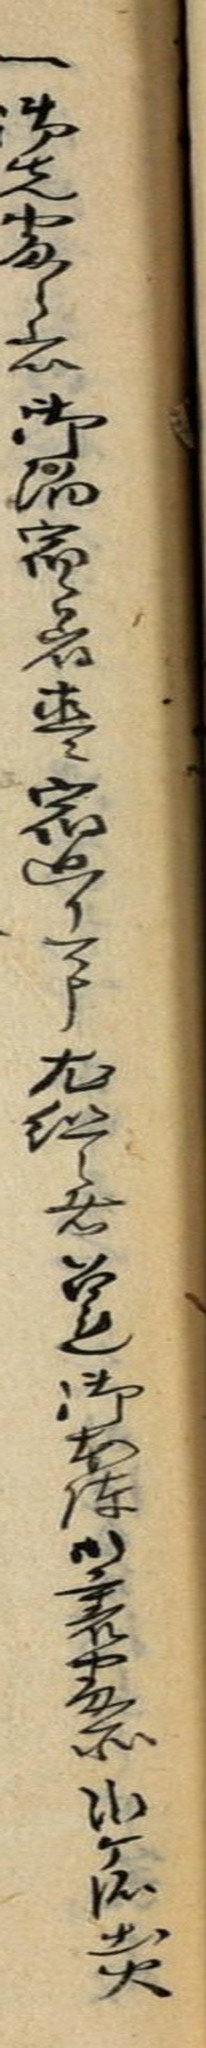一御先番之者御泊宿へ着直に宿廻り可申尤組之者召連御本陣御裏番所弐ヶ所出火
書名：三都并道中之部
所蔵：福井県文書館 Fukui Prefectural Archives
